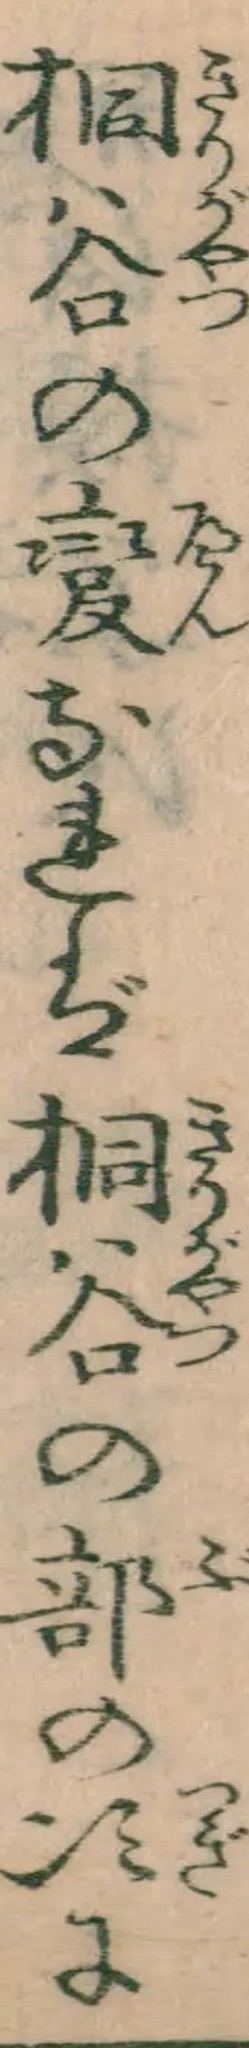桐谷の変なれば桐谷の部の次に
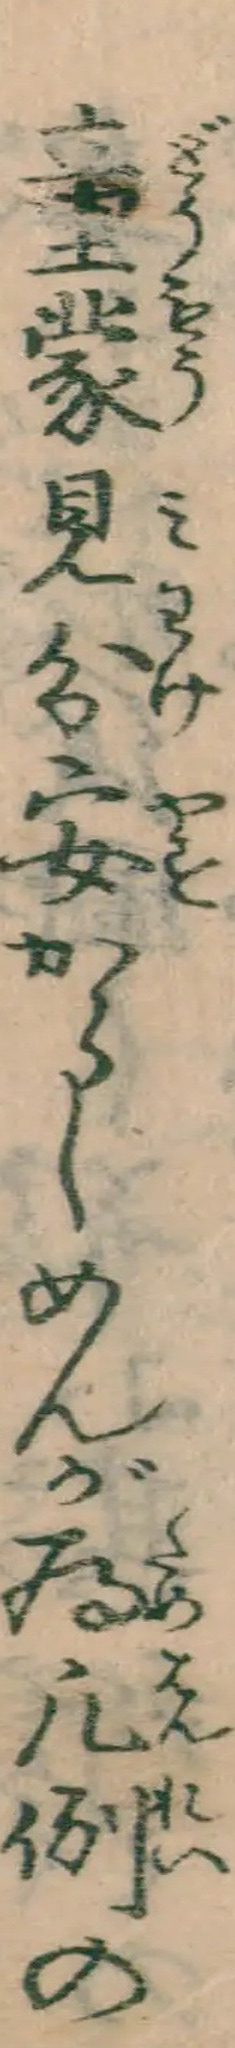一童蒙見分安からしめんが為凡例の

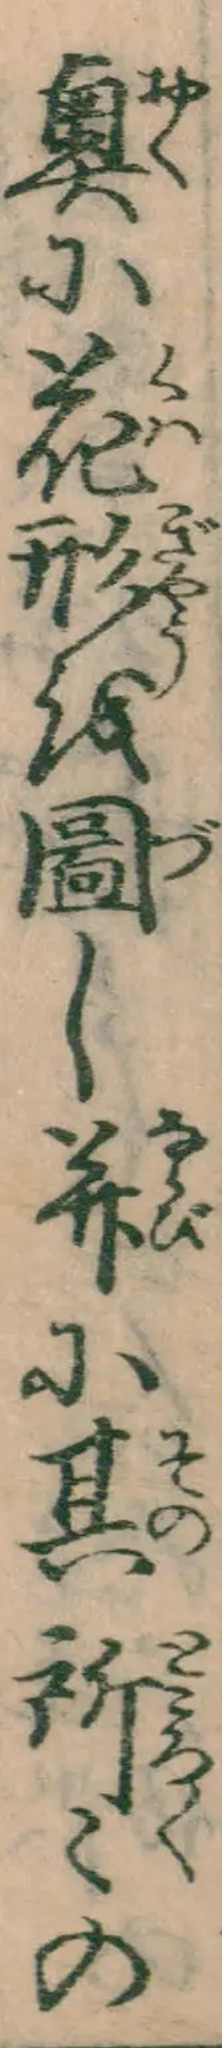奥に花形を図し并に其所々の
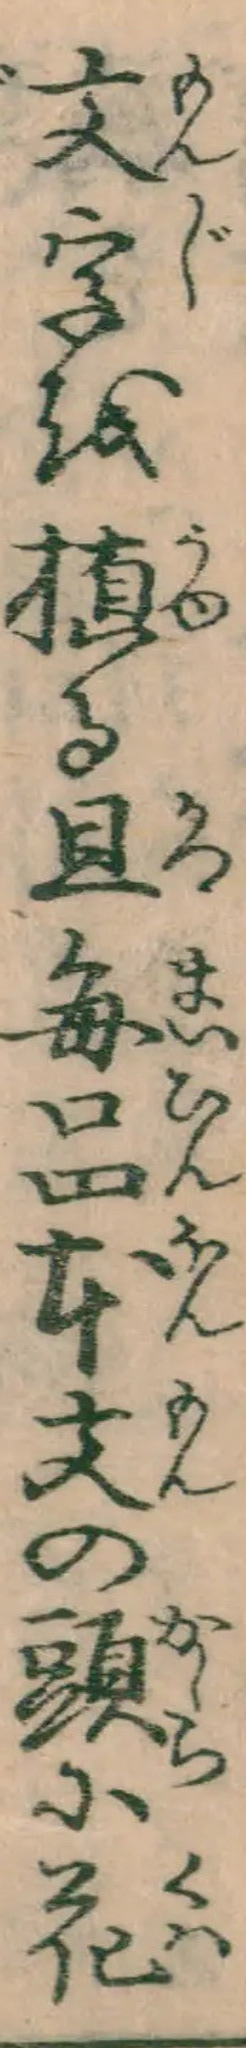文字を植る且毎品本文の頭に花
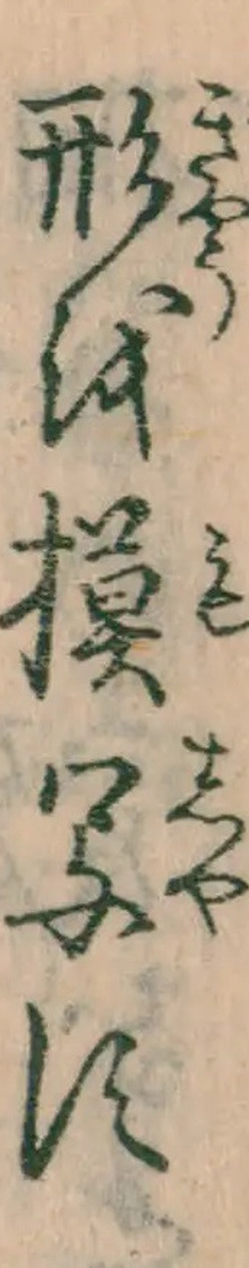形を摸写す
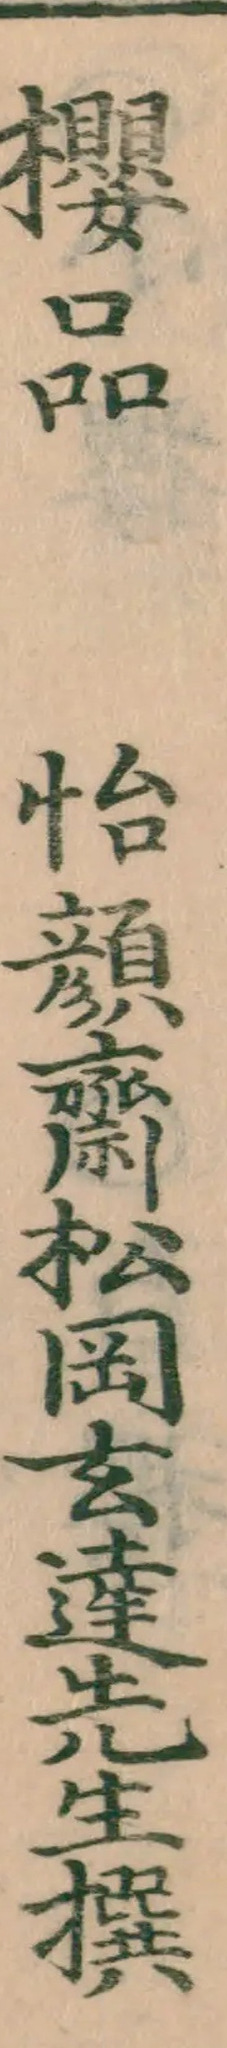桜品怡顔斎松岡玄達先生撰

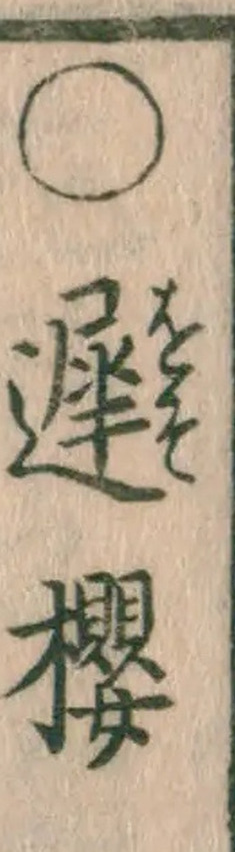○遅桜
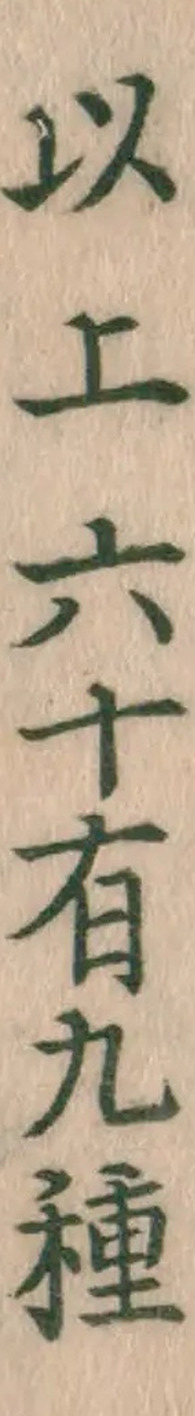以上六十有九種

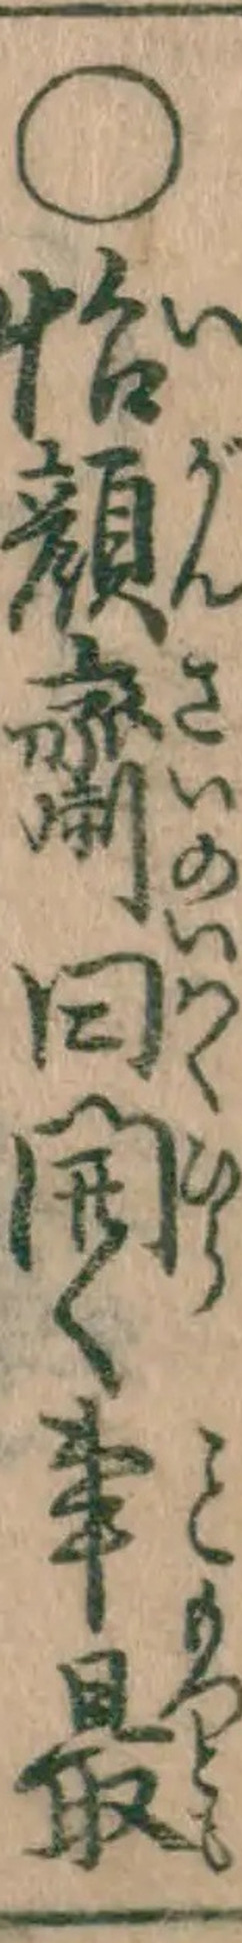○怡顔斎曰開く事最
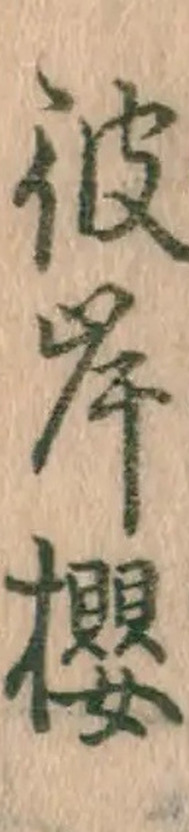彼岸桜
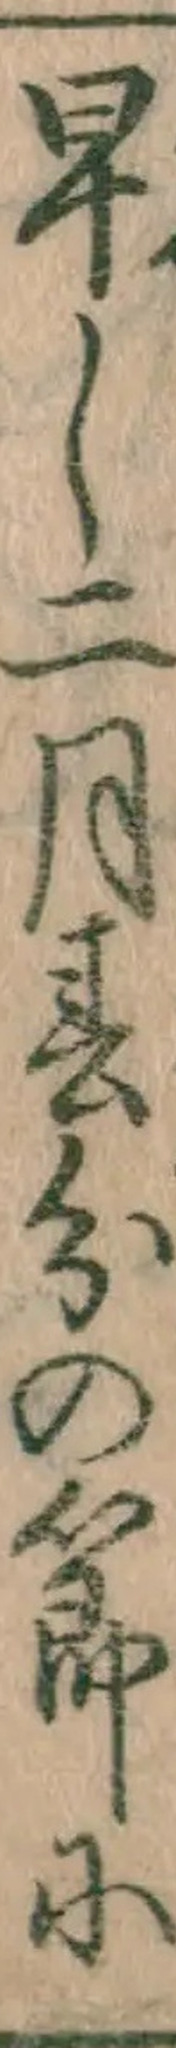早し二月春分の節に
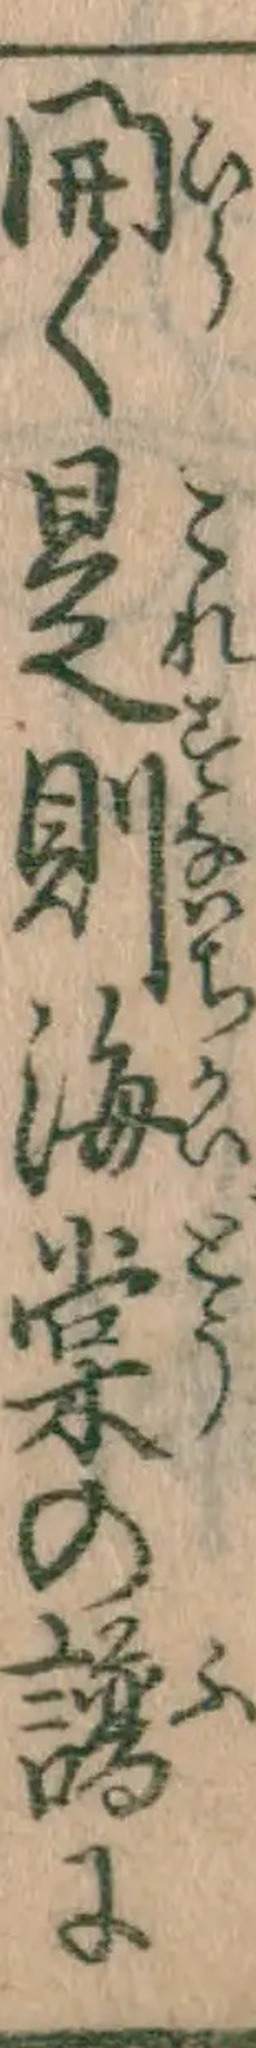開く是則海棠の譜に
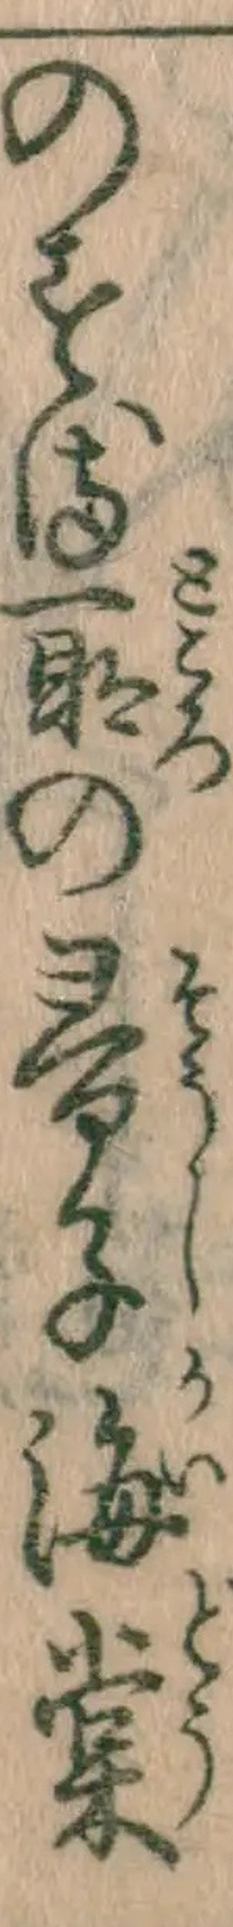のする所の帚子海棠
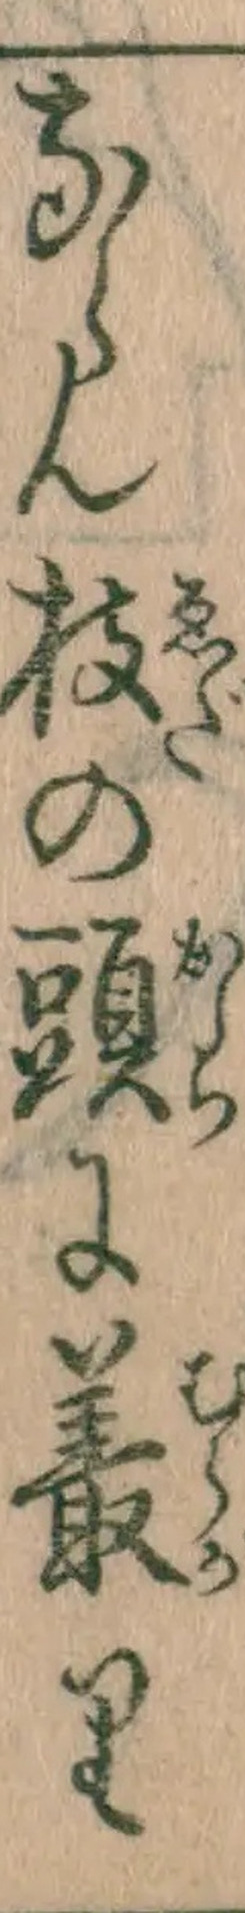ならん枝の頭に叢り
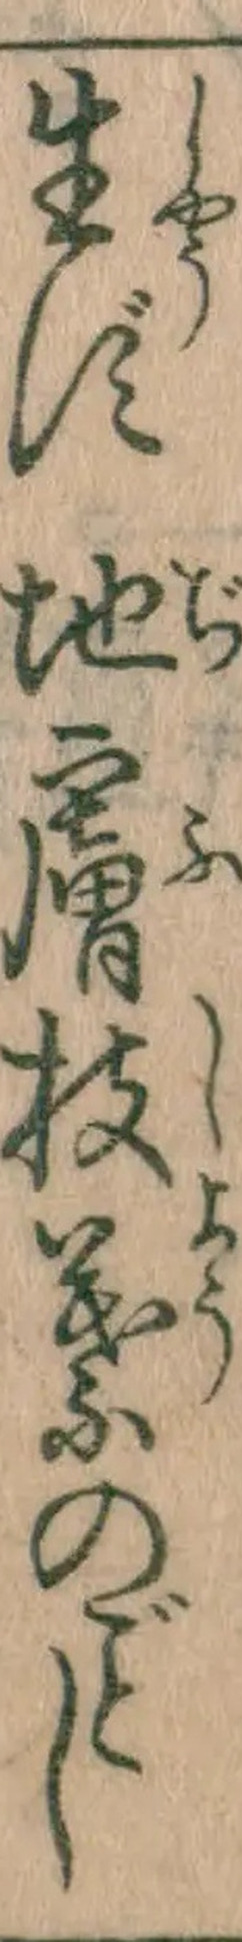生ず地膚枝葉のごとし
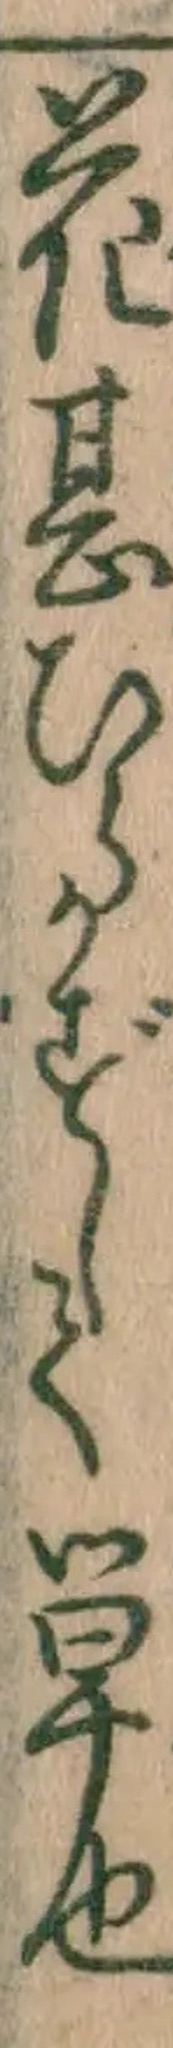花甚ひらかずして単也
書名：怡顔齋櫻品
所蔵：国立国会図書館 National Diet Library, JAPAN
